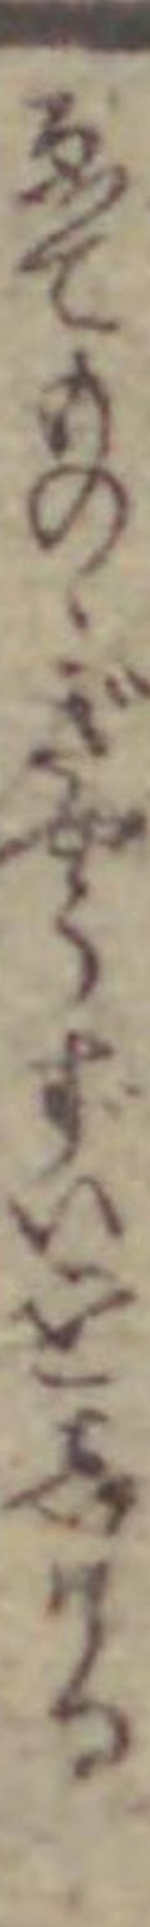ゑてものゝぎやうすいをしける
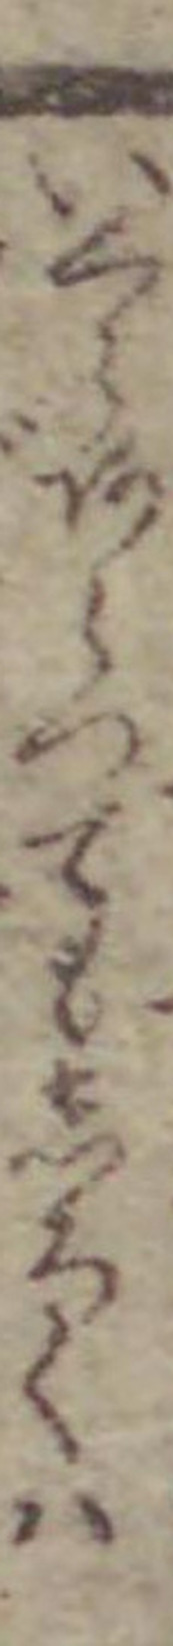いくらあらつてもしろくハ
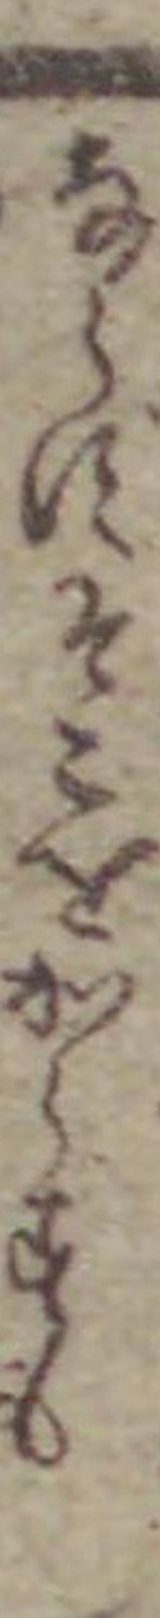ならずそこをからすも
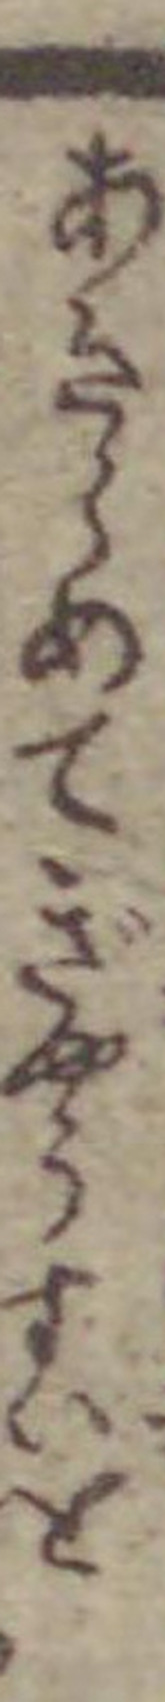あきらめてぎやうすいを
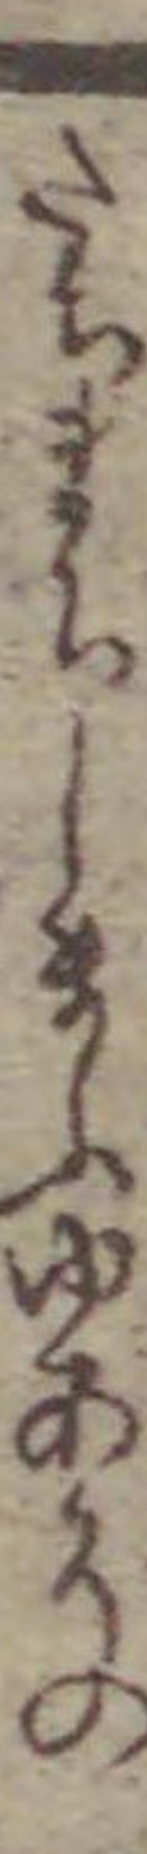たちまちしまふゆあかりの
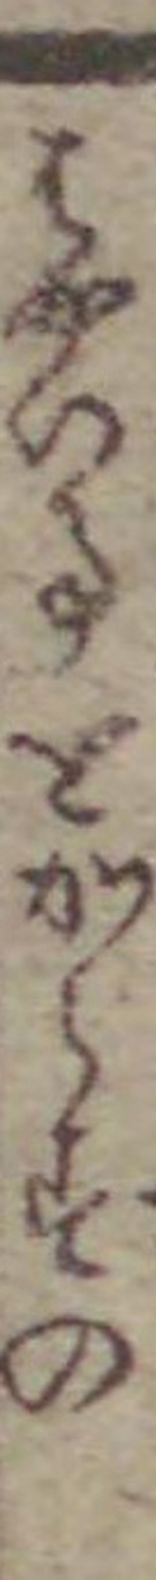はやい事をからすの
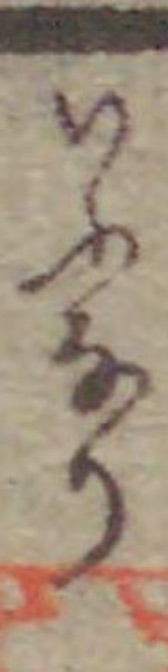いふなり

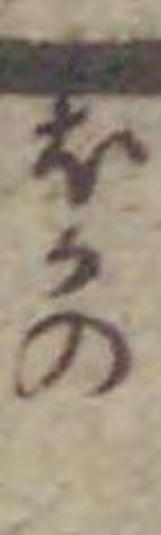ほかの
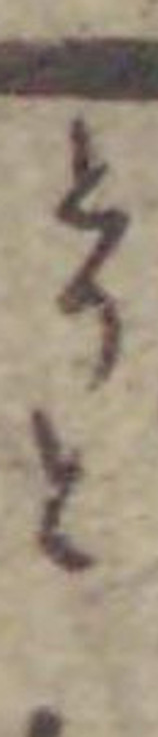とりと
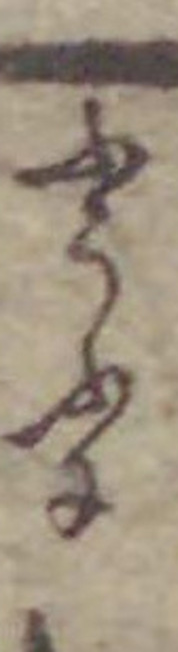ふうふに
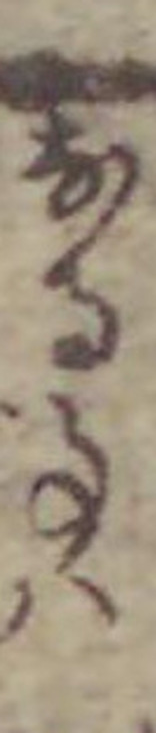なる事ハ
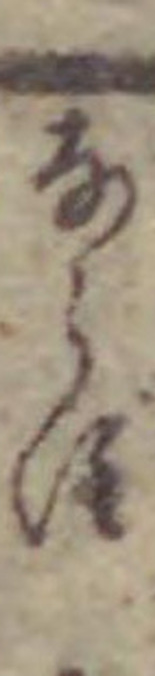ならず
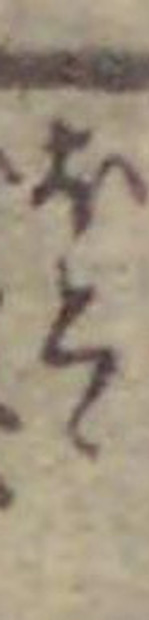ほとゝ
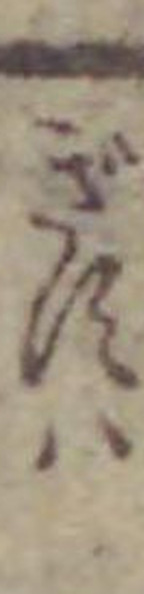ぎすハ
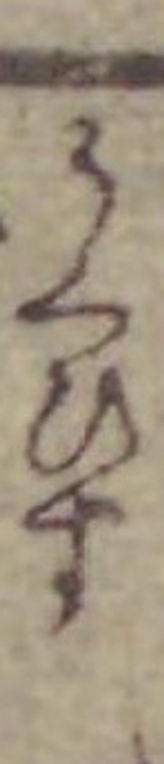うくひす
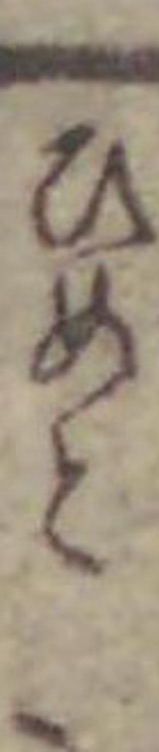ひめと
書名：烏行水諺草 3巻
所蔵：国立国会図書館 National Diet Library, JAPAN
